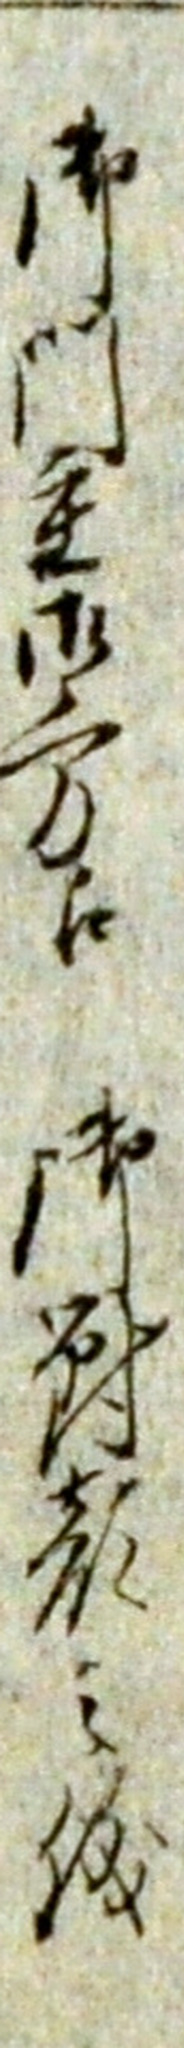御門主御江御対顔之儀
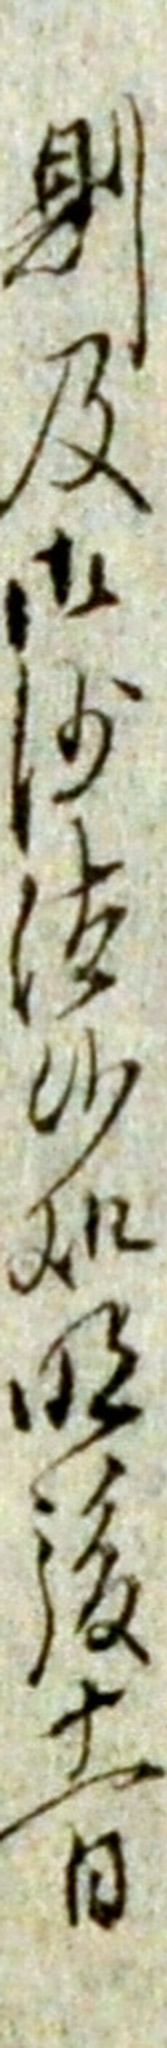則及御沙汰候処明後十一日
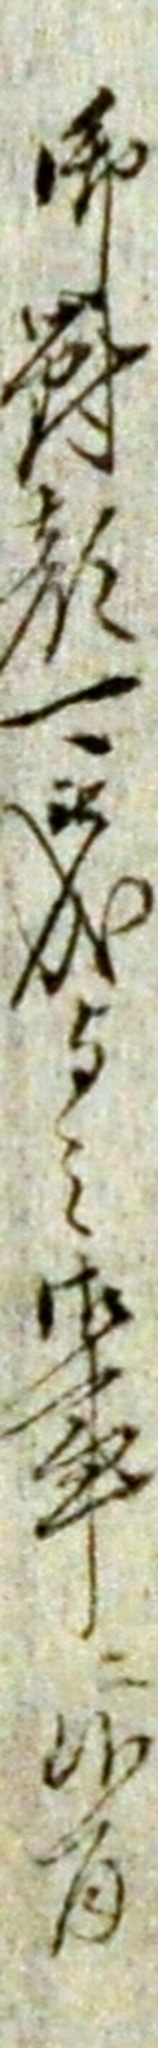御対顔可被成与之御事二候間
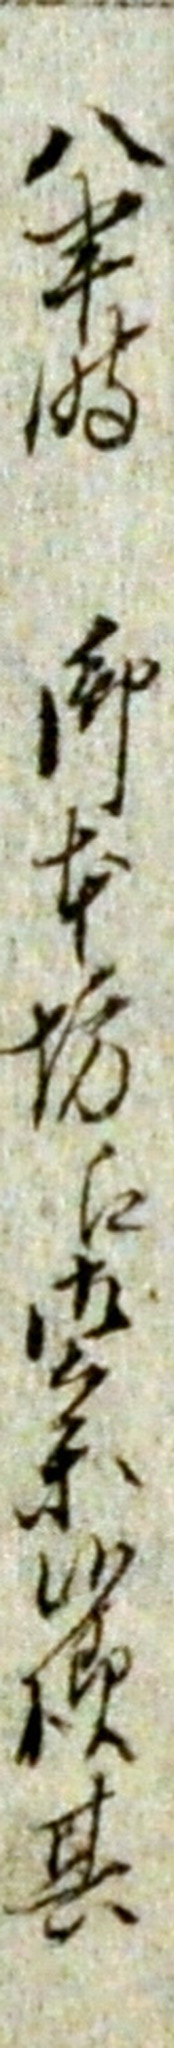八半時御本坊江御参候様其
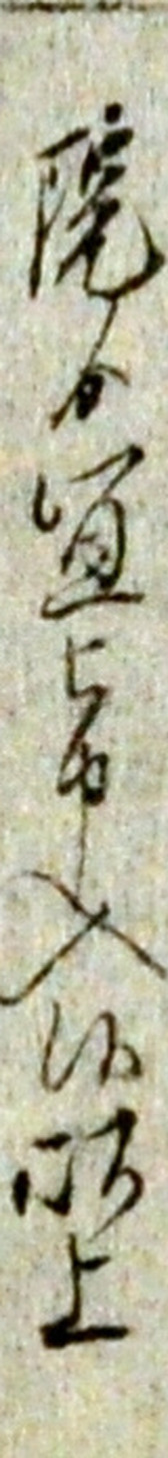院ゟ宜ヒ申入候以上
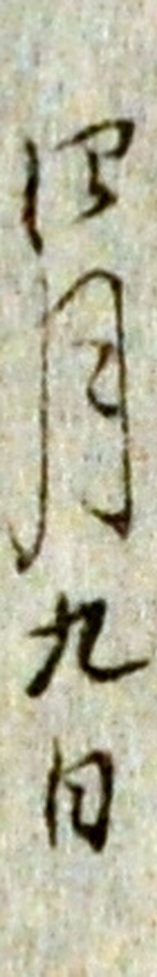四月九日
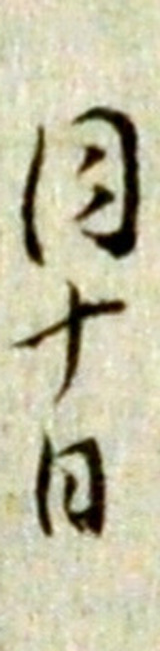同十日
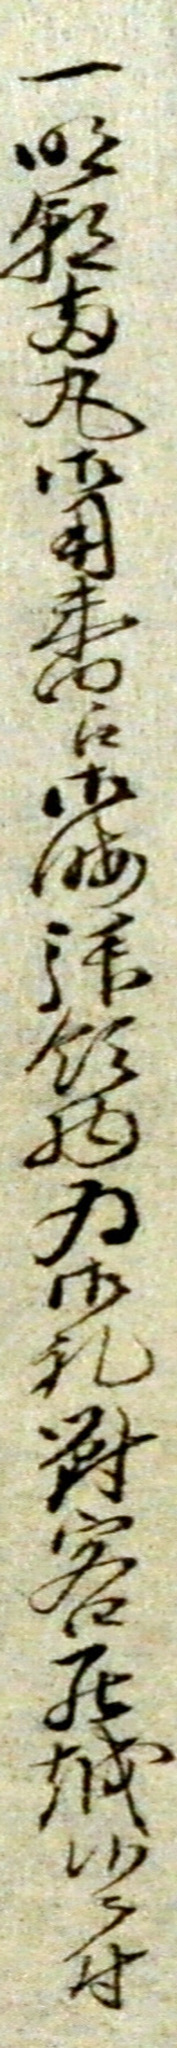一明朝両丸御用番江御暇拝領物為御礼対客罷越候ニ付
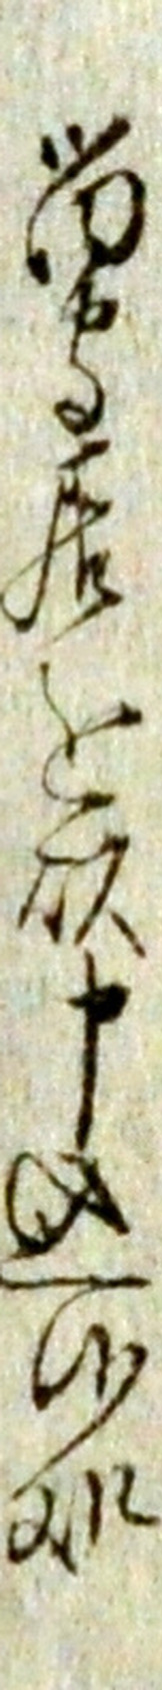留守居を以申込候処
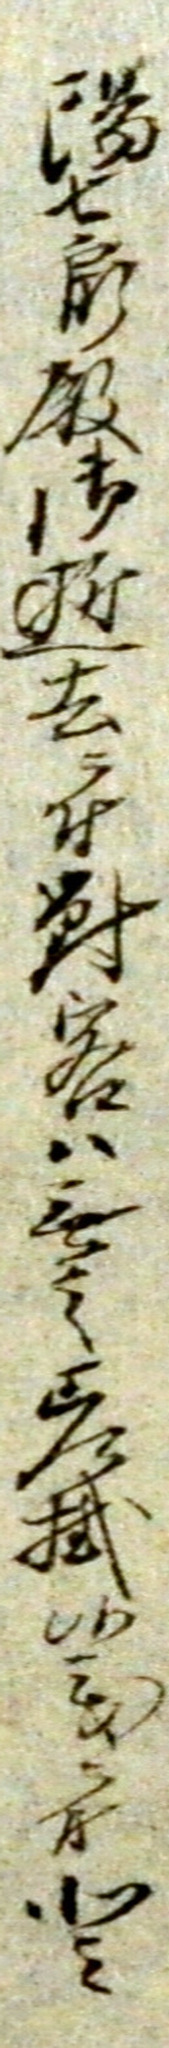陽七郎殿御逝去ニ付対客ㇵ無之差掛候義ニ付登
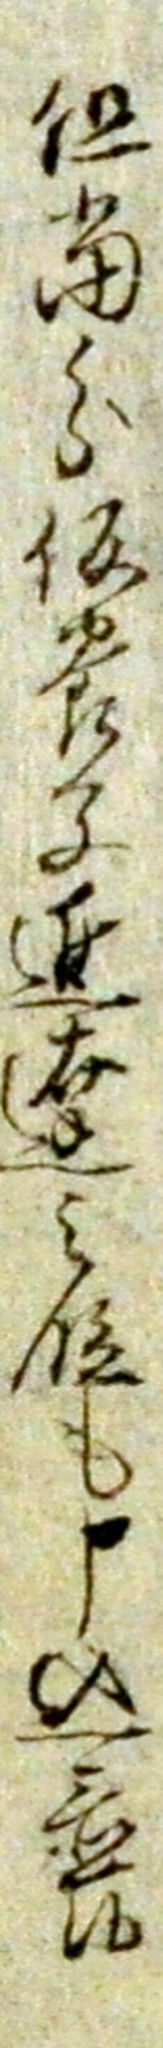但当分仮養子近達之段も申込置候
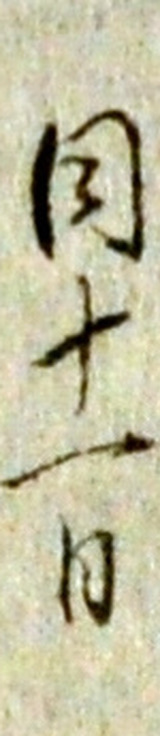同十一日
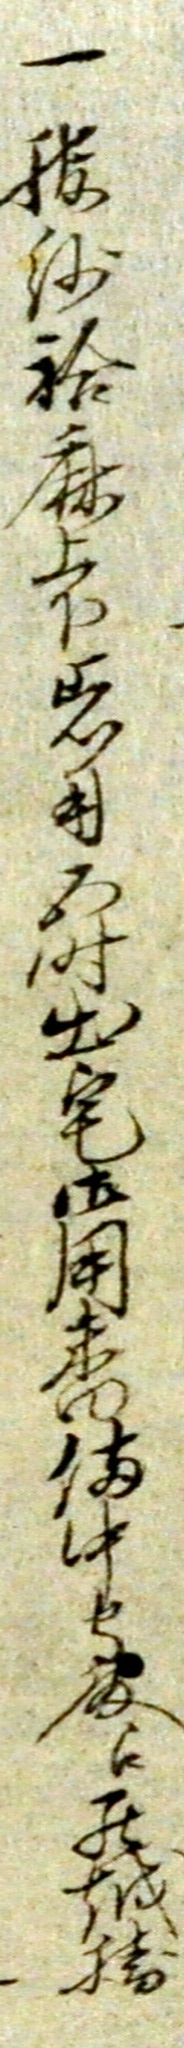一服紗袷麻上下着用五時出宅御用番備中守殿江罷越勝
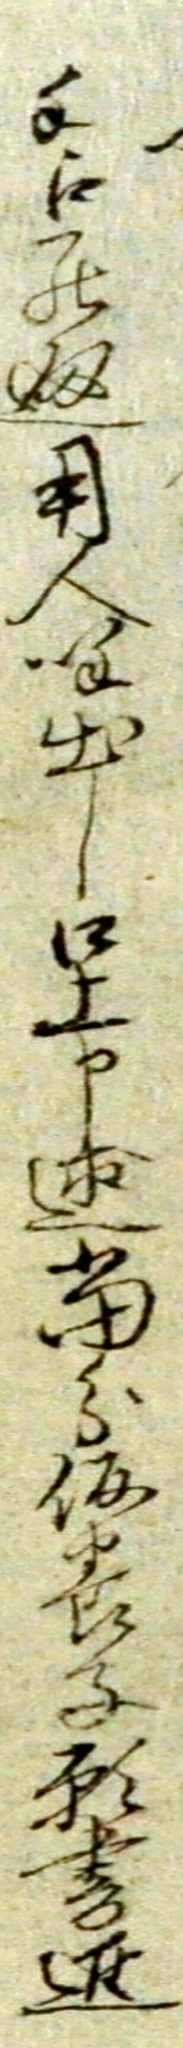手江罷通用人呼出口上申述当分仮養子願書近
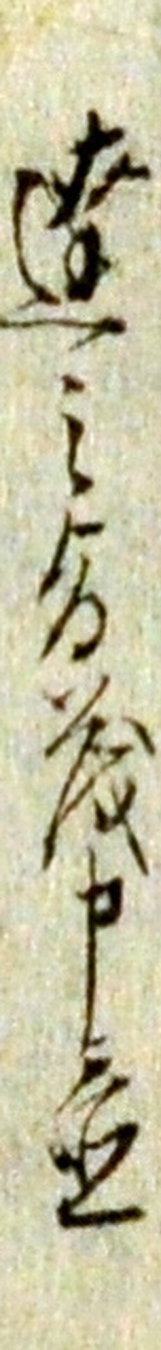達之旨茂申置
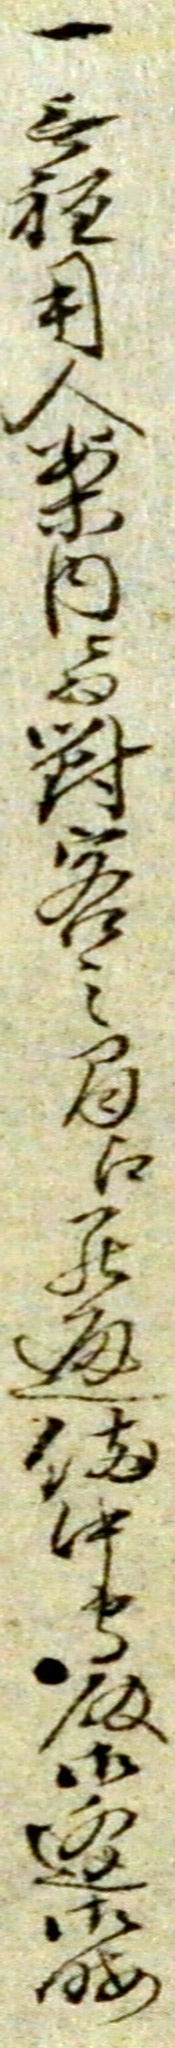一無程用人案内ニ而対客之間江罷通備中守殿御逢御暇
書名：日光御名代相勤候節ノ留
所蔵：伊那市立高遠町図書館・合同会社AMANE
